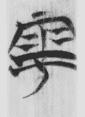𩁹
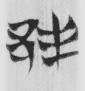邦
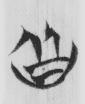皆
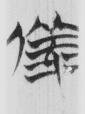備
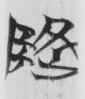{阩止}
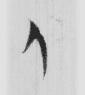人
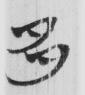多
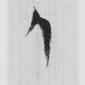人
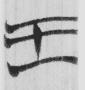王
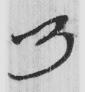乃
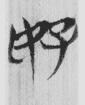好
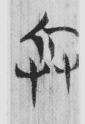兵
